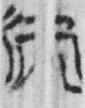凥（处）
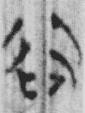谷（欲）
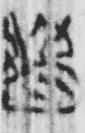○（逸）
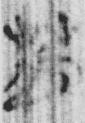○（易）
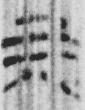而
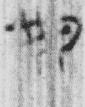母
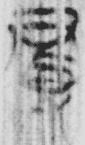曼（慢）
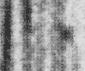君
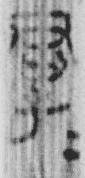子君
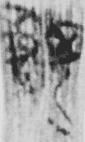執
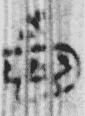志
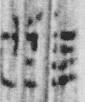必
